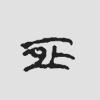恆
